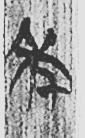年
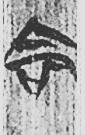命（令）
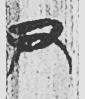尹
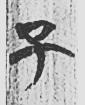子
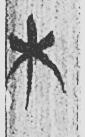木
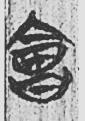會
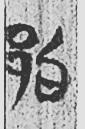{勺阝}
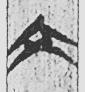文
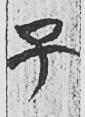子
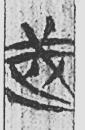武
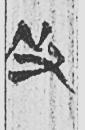及
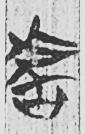者
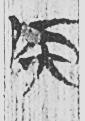侯
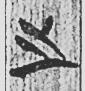之
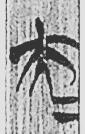夫=
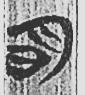明
